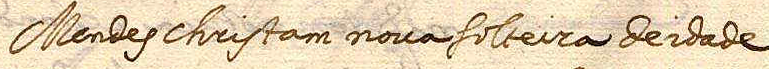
Mendes christam noua solteira de idade
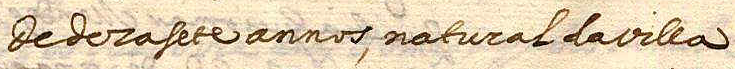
de dezasete annos, naturaL da villa
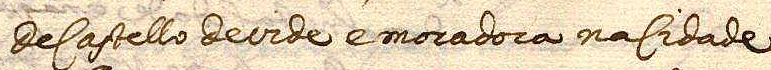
de Castello de vide e moradora na Cidade
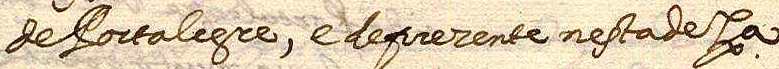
de Portalegre, e de prezente nesta de Lxa.
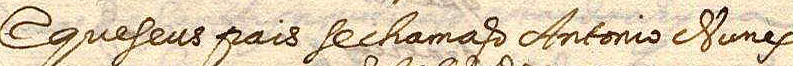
E que seus pais se chamaõ Antonio Nunes
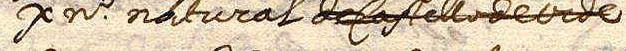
xn.o naturaL _
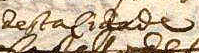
desta Cidade
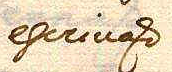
escriuaõ
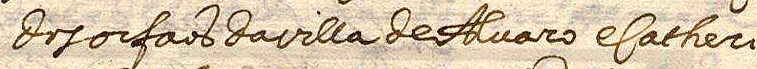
dos orfaõs da villa de Aluaro e Catheri
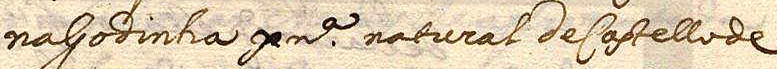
na Godinha xn.a natural de Castello de
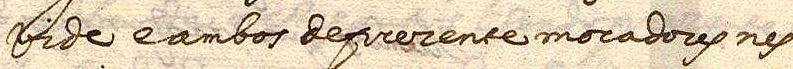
vide e ambos de prezente moradores nes
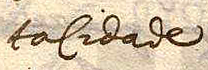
ta Cidade
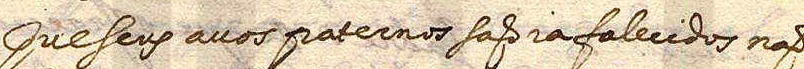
Que seus auos paternos saõ ia falecidos naõ
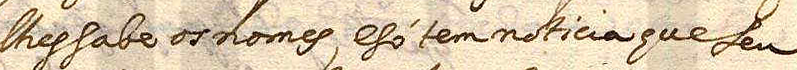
lhes sabe os nomes, e só tem noticia que seu
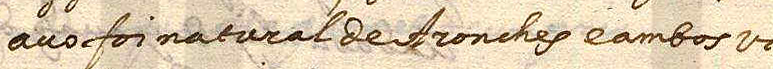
auo foi naturaL de Aronches e ambos vi
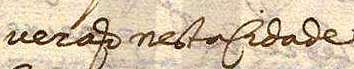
uerão nesta Cidade
